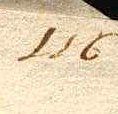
116
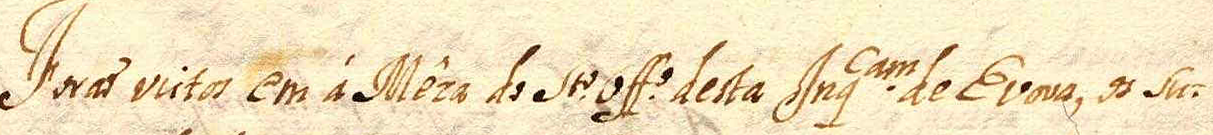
Foraõ vistos em á Mêza do s.to off.o desta Jnq.çam de Evora, os su
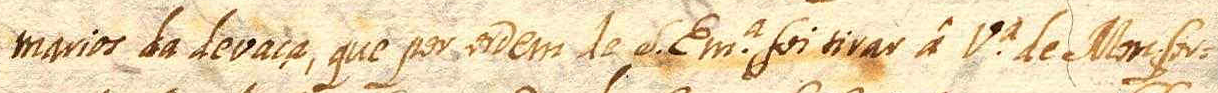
marios da devaça, que por ordem de S. Em.a foi tirar á V.a de Monfor
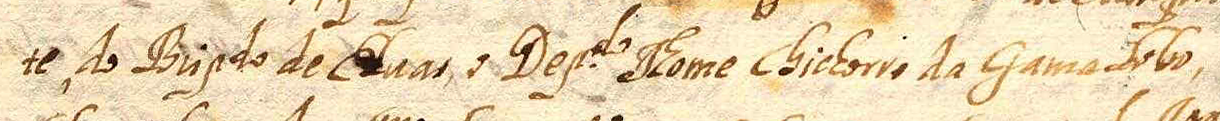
te, do Bispdo de Eluas, o Dep.do Thome Chichorro da Gama Lobo,
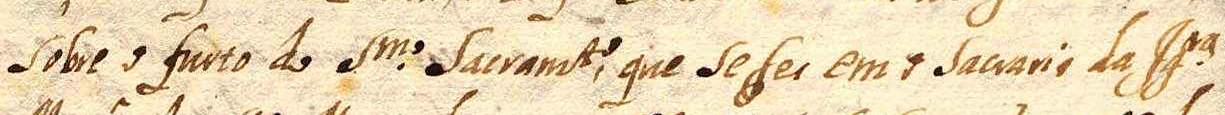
sobre o furto do Sm.o Sacramto, que se fes em o Sacrario da Jg.ra
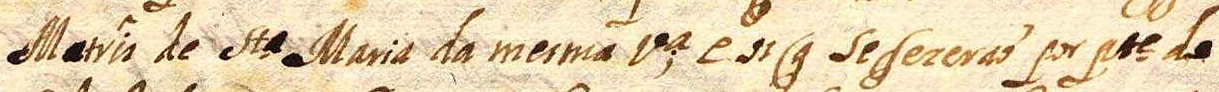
Matris de st.a Maria da mesma Va; e os q̄ se fezeraõ por pt.e do
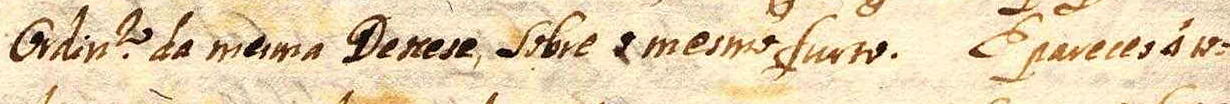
Ordin.ro da mesma Deocese, sobre o mesmo furto. E pareceo á to
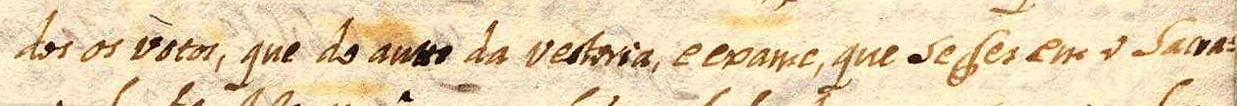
dos os votos, que do autto da vestoria, e exame, que se fes em o Sacra
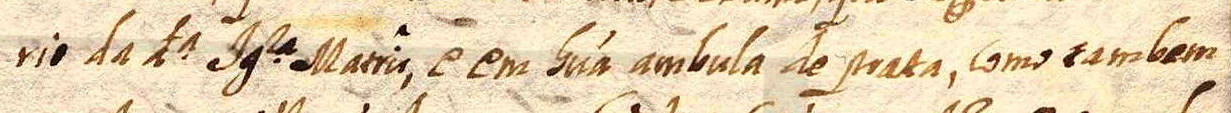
rio da d̄.a Ig.ra Matris, e em huā ambula de prata, como tambem
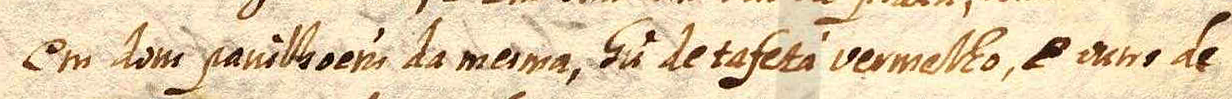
em dous pauilhoens da mesma, hū de tafetá vermelho, e outro de
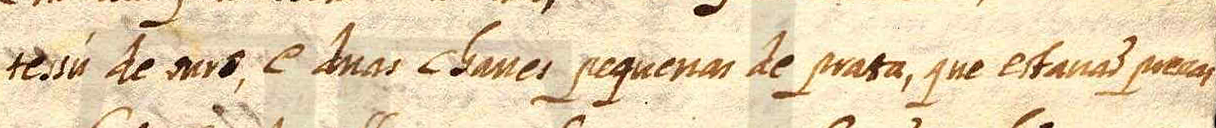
tessú de ouro, e duas chaues pequenas de prata, que estauaõ prezas
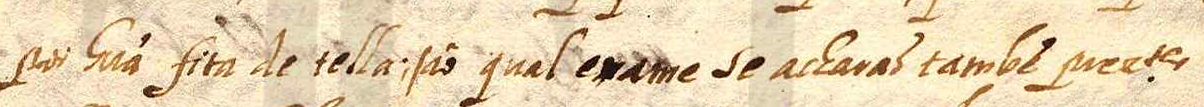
por huā fita de tella; / áo qual exame se acharaõ tambē prez.tes
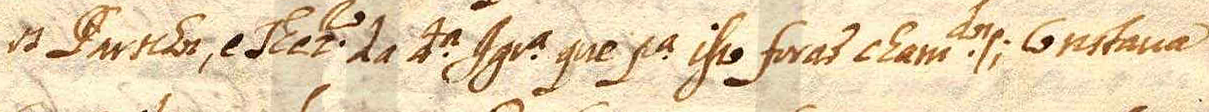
os Parochos, e Thez.ro da d̄.a. Jgr.a que p.a isso foraõ cham.dos /; constaua
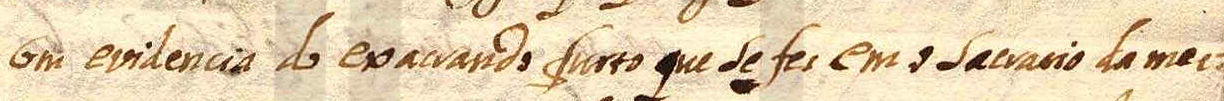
com evidencia do exacrando furto que se fes em o Sacrario da mes
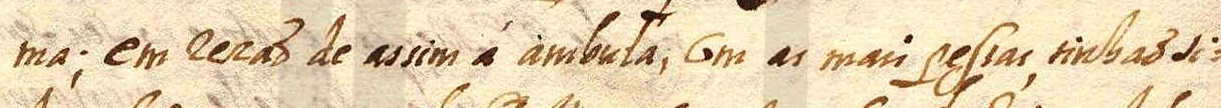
ma; em Rezaõ de assim á ambula, com as mais pessas tinhaõ si
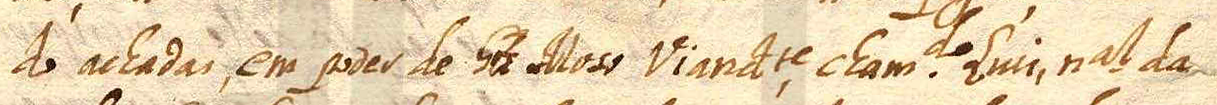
do achadas, em poder de hū Moso Viand̄te, cham.do Luis, nal da
